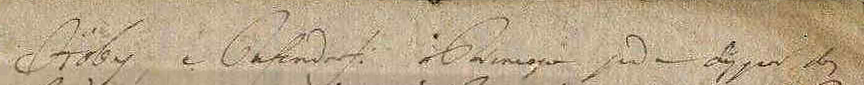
Hobes, e Pufendorf: o Princepe pode dispor dos
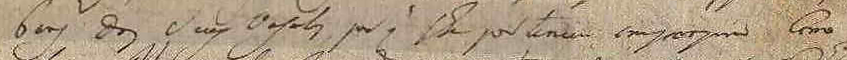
bens dos seus vasalos, porq̄ lhe pertencen em proprio Como
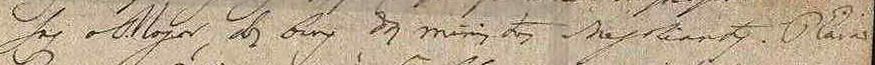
fas o Mayor, dos bens dos ministos Negociantes. Pharao
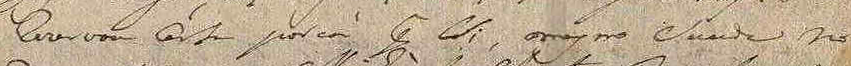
Rezervou Carta por ca q̄ si, o mesmo sucede no
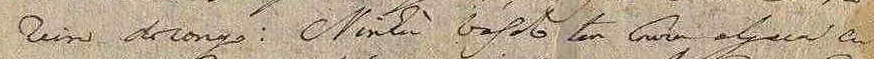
Reino do congo: Ninhū vasalo ten Couza alguā en
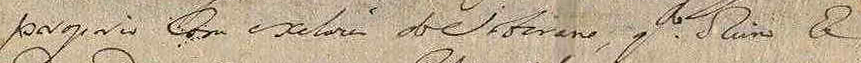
proporio Com excluzā do Soberano, q.do o Reino he
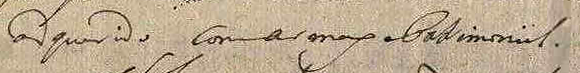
adquerido com armas e Patrimonial.
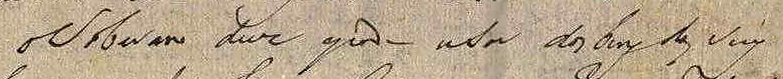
o Soberano deve e pode usar dos bens dos seus
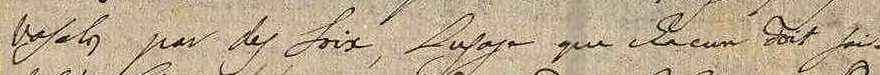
vasalos par des Loix, Lusage que chacun doit faire
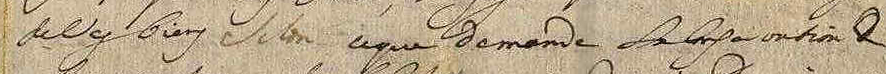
de ses biens Selon ce que demande La Conservation de
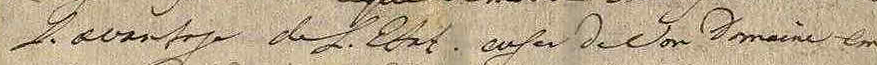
L.avantage de L.Etat. e user de Son Domaine emi
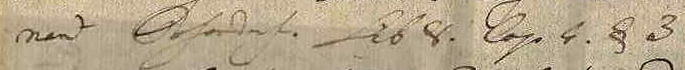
nant Pufendorf. Lib 8. Cap 4. § 3
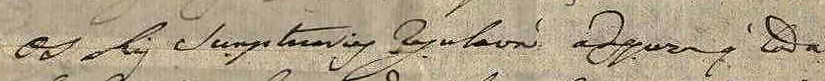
Os Leis Sumptuarias Regulavā a despeza q̄ Cada
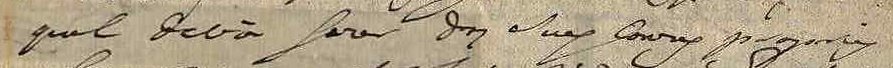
qual devia fazer das suas Couzas proprias
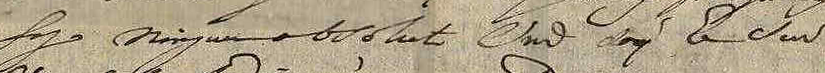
Logo ninguem absoluto Snr̄ do q̄ he seu
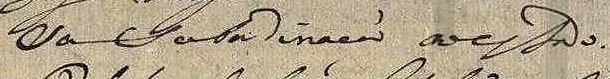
sen subordinação ao estado.
